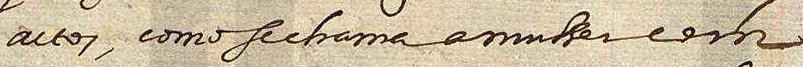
actos, como se chama a mulher com
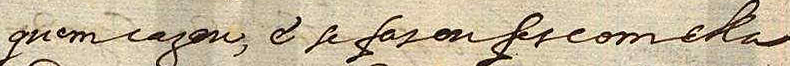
quem cazou, e se faz ou fes com ella
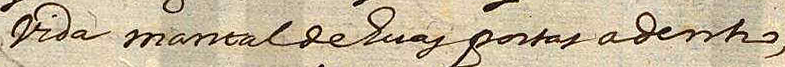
Vida marital de huas portas adentro
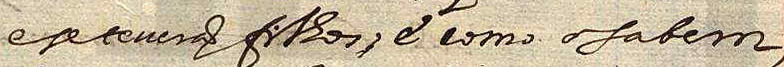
e se teuerão filhos; e como o sabem
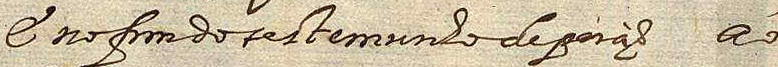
e no fim do testemunho deporaõ ao
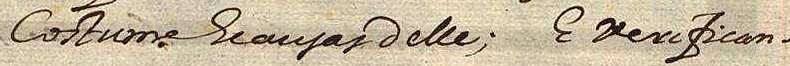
Costume E causas delle; E verifican
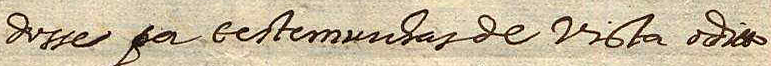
dosse por testemunhas de vista o ditto
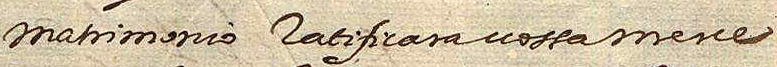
matrimonio ratificara uossa merce
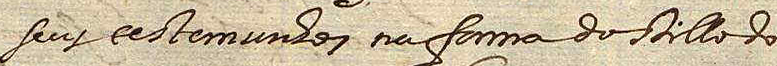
seus testemunhos na forma do stillo do
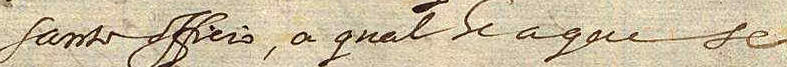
santo officio, a qual he a que se
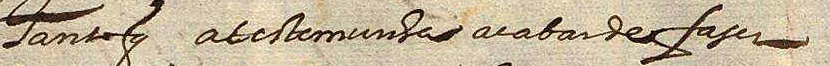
Tanto q̄ a testemunha acabar de faser
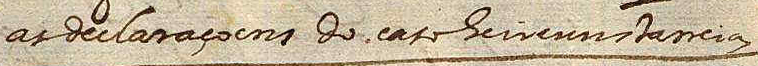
as declaraçoens do caso E circunstancias
